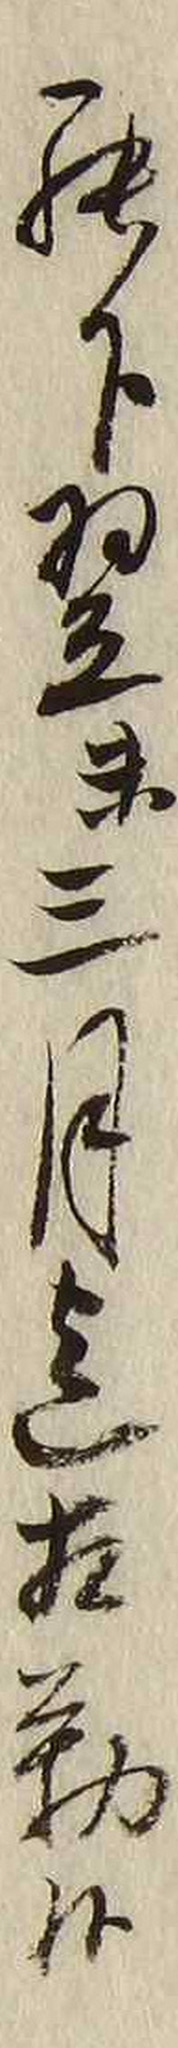罷下翌未三月迄相勤候

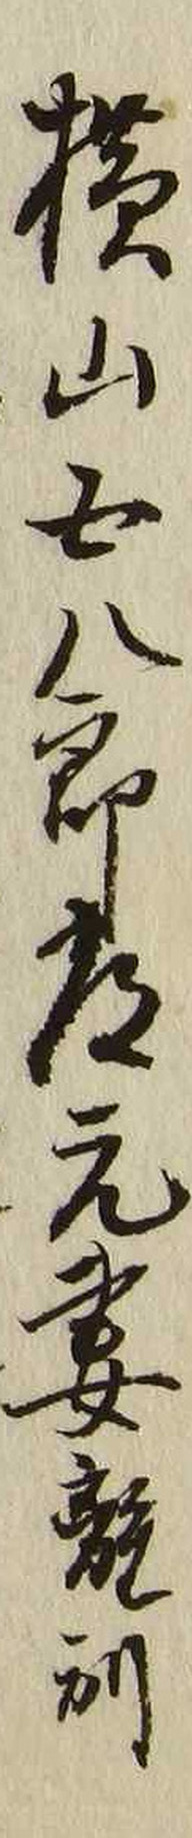女横山五八郎常元妻離別
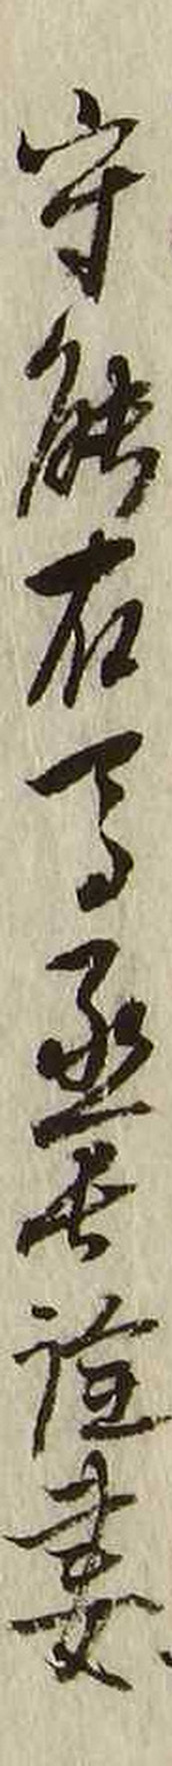守能右馬丞長詮妻
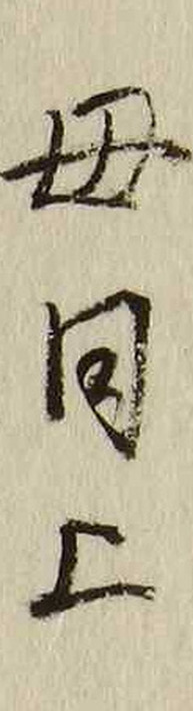母同上
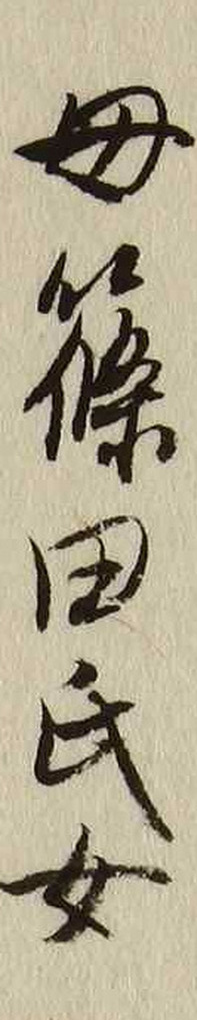母篠田氏女
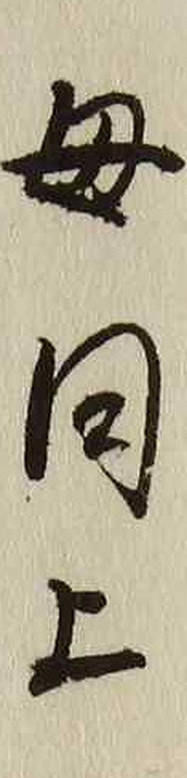母同上

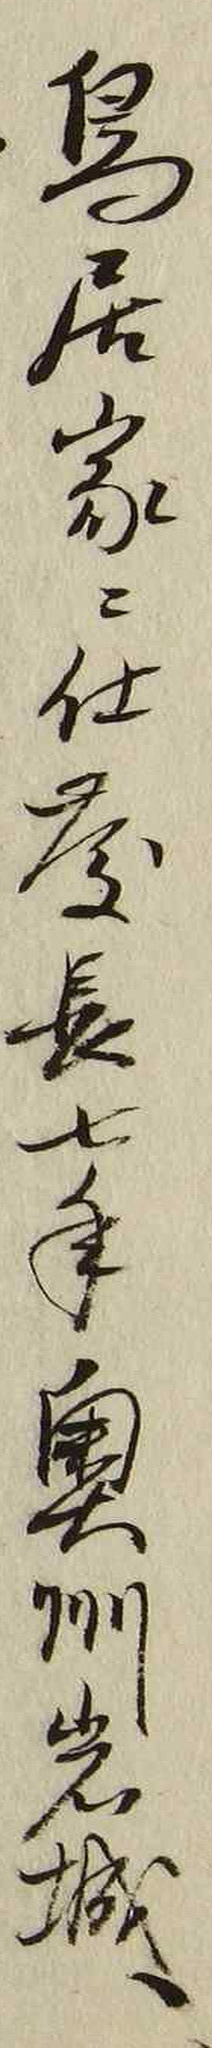鳥居家ニ仕慶長七年奥州岩城へ
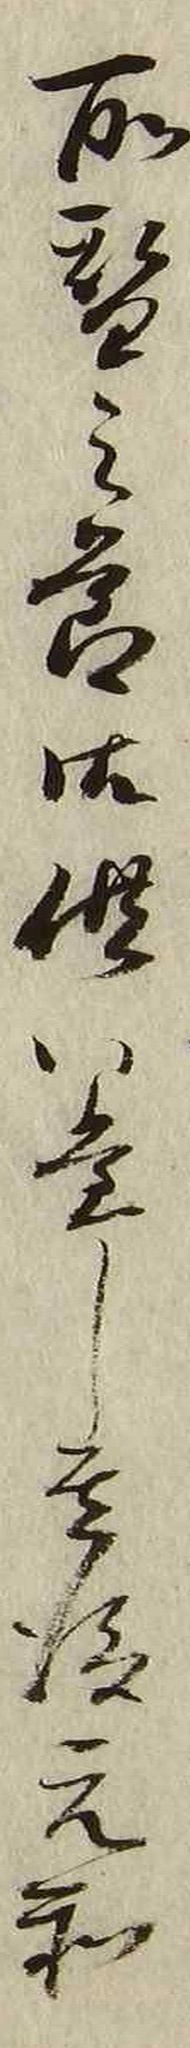所替之節御供いたし其後元和
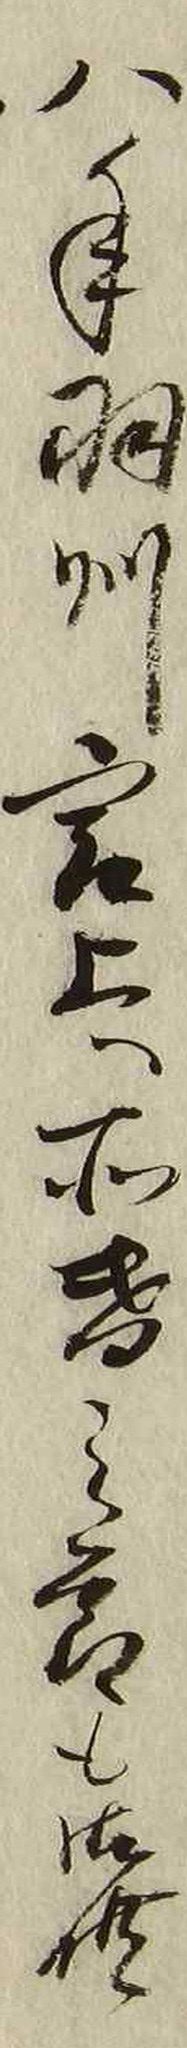八年羽州最上へ所替之節も御供
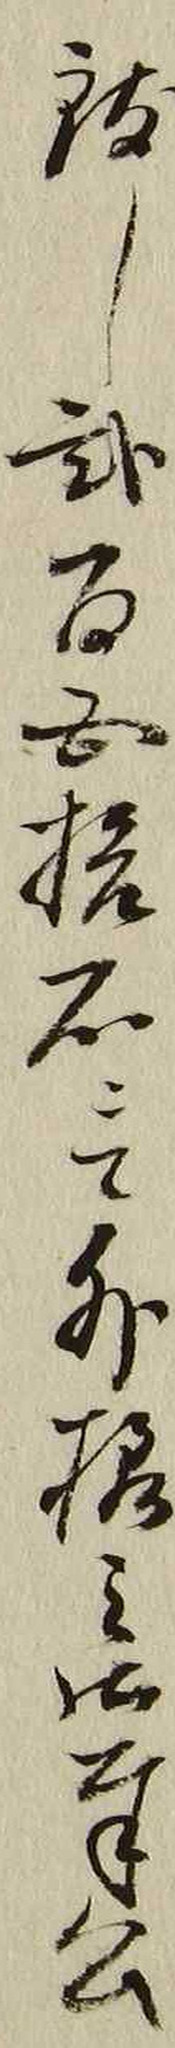致し弐百五拾石ニて外様之御奉公
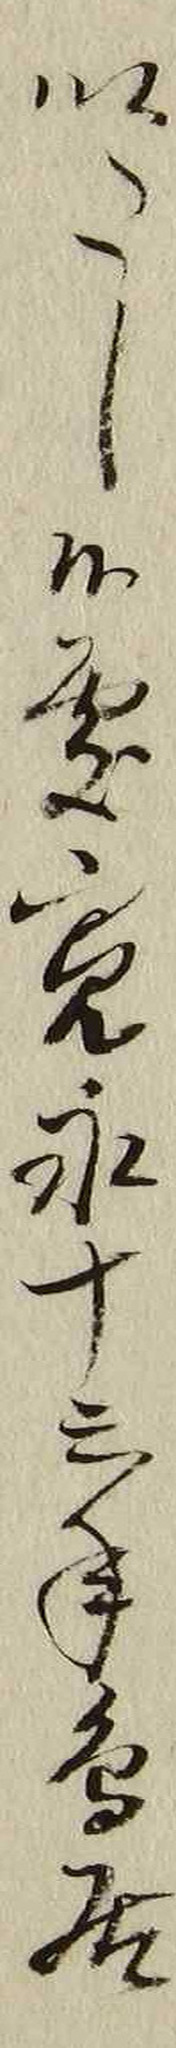いたし候処寛永十三年鳥居
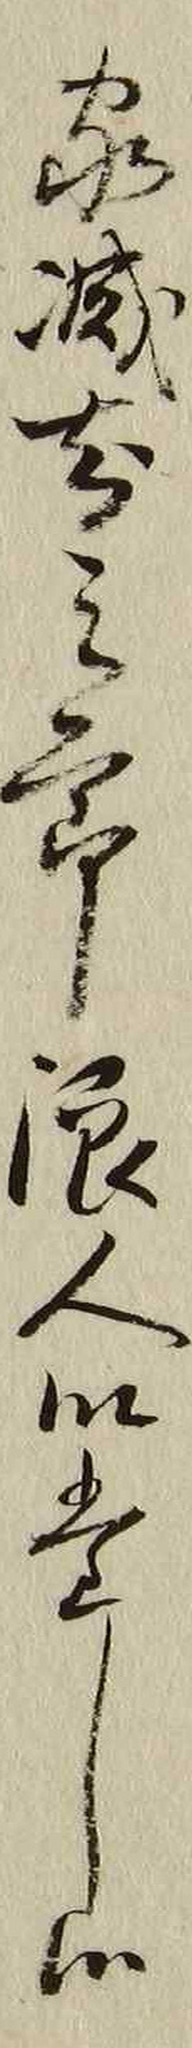家減知之節浪人いたし候
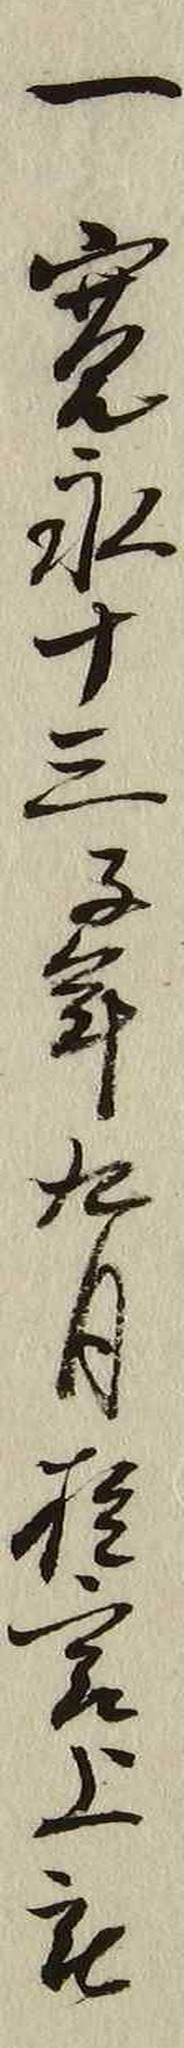一寛永十三子年九月於最上被
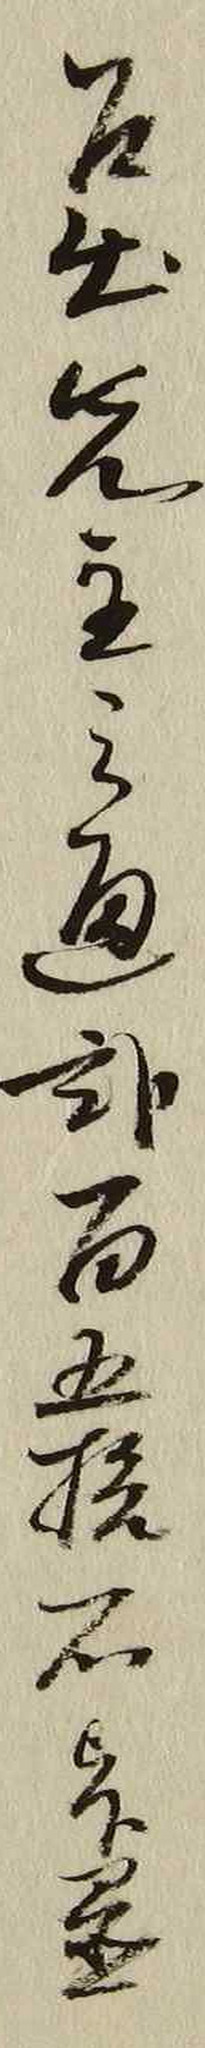召出先主之通弐百五拾石被下置
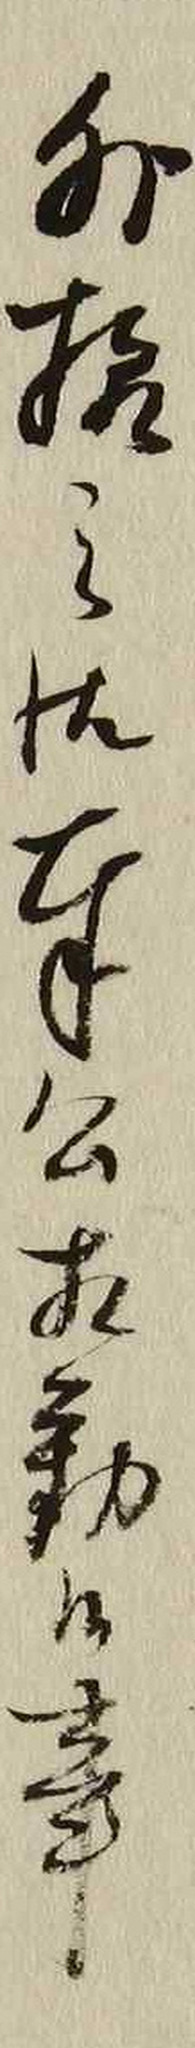外様之御奉公相勤候事
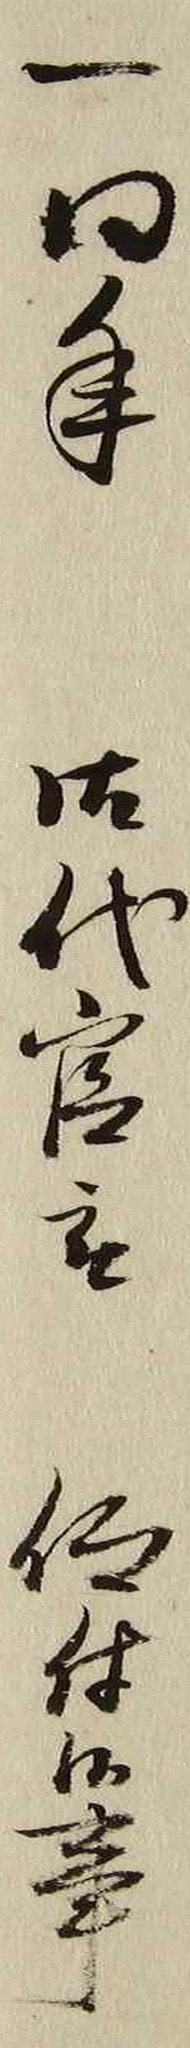一同年御代官被仰付候事
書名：諸士系譜　巻之356　す之部6
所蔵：会津若松市立会津図書館
